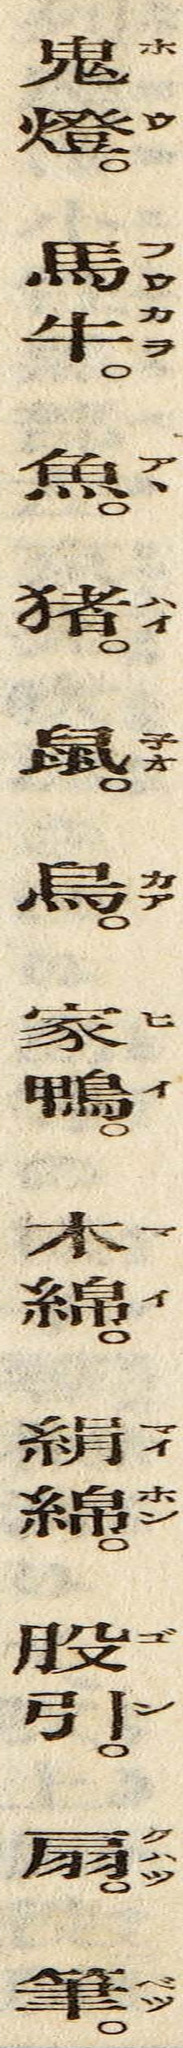鬼灯。馬牛。魚。猪。鼠。烏。家鴨。木綿。絹綿。股引。扇。筆。
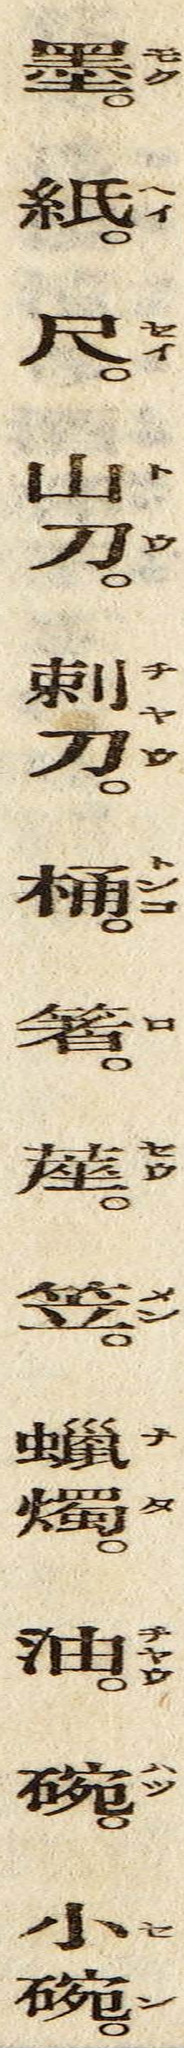墨。紙。尺。山刀。剌刀。桶。箸。蓙。笠。蝋燭。油。碗。小碗。
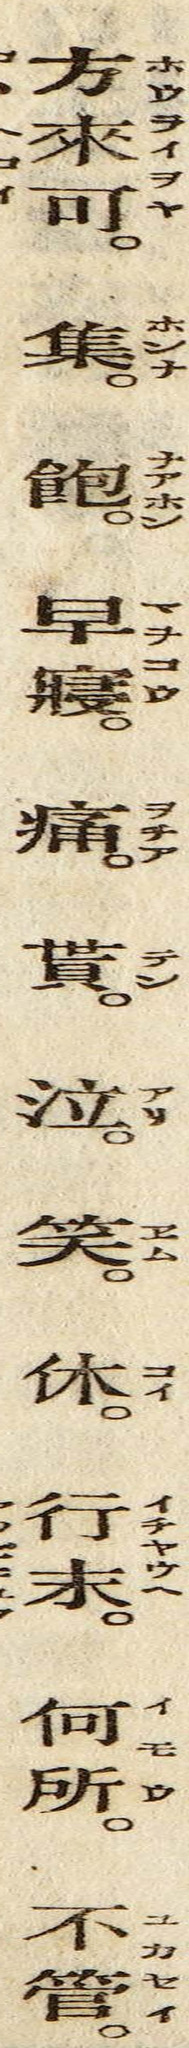方来可。集。飽。早寝。痛。貰。泣。笑。休。行末。何所。不管。

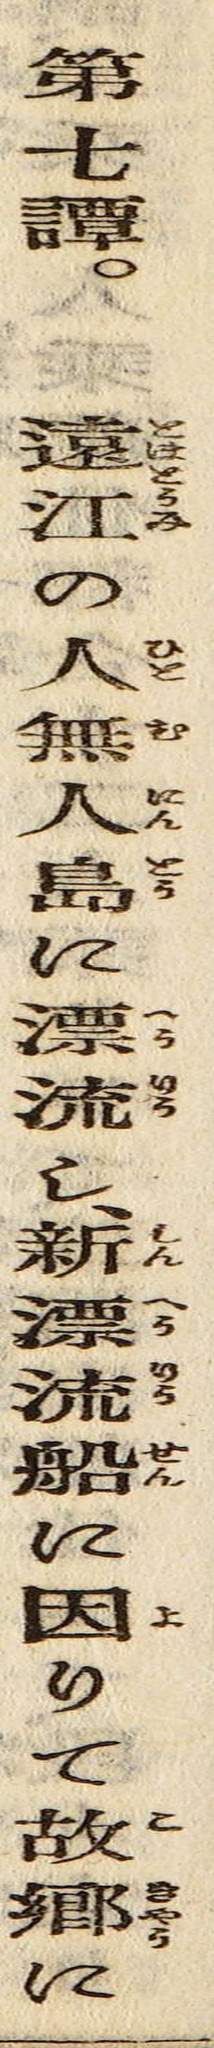第七譚。遠江の人無人島に漂流し、新漂流船に因りて故郷に
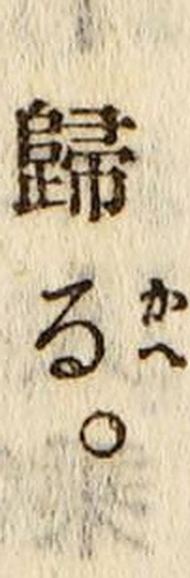帰る。
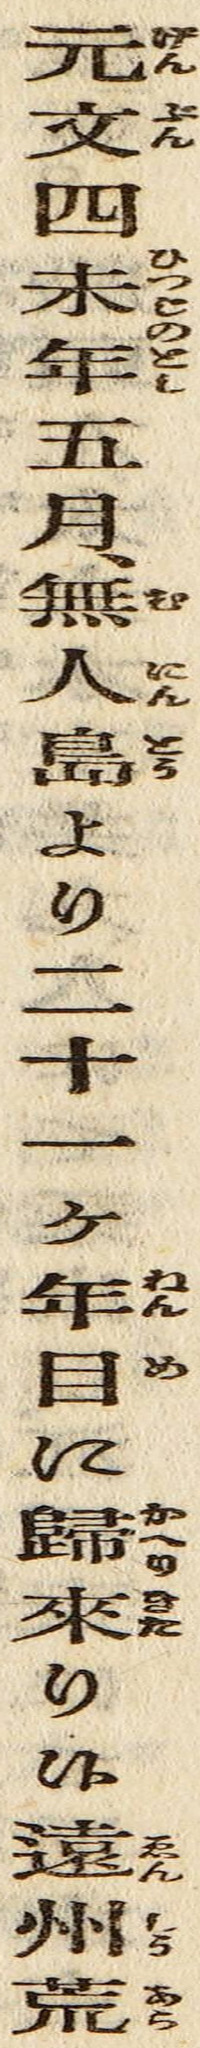元文四未年五月、無人島より二十一ケ年目に帰来り候遠州荒
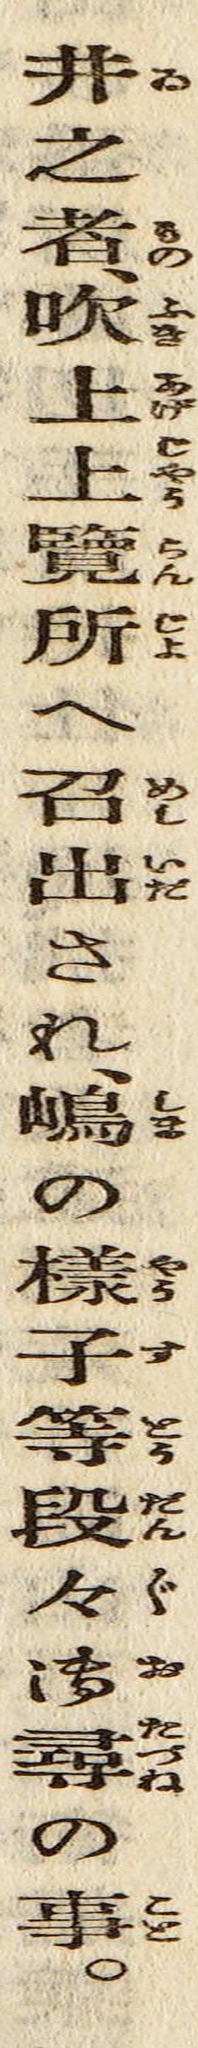井之者、吹上上覧所へ召出され、嶋の様子等段々御尋の事。
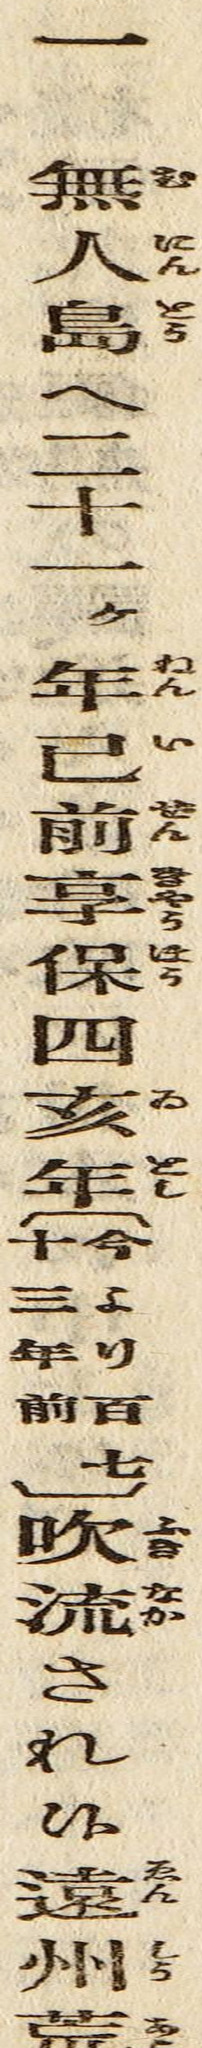一無人島へ二十一ヶ年已前享保四亥年[今より百七十三年前]吹流され候遠州荒
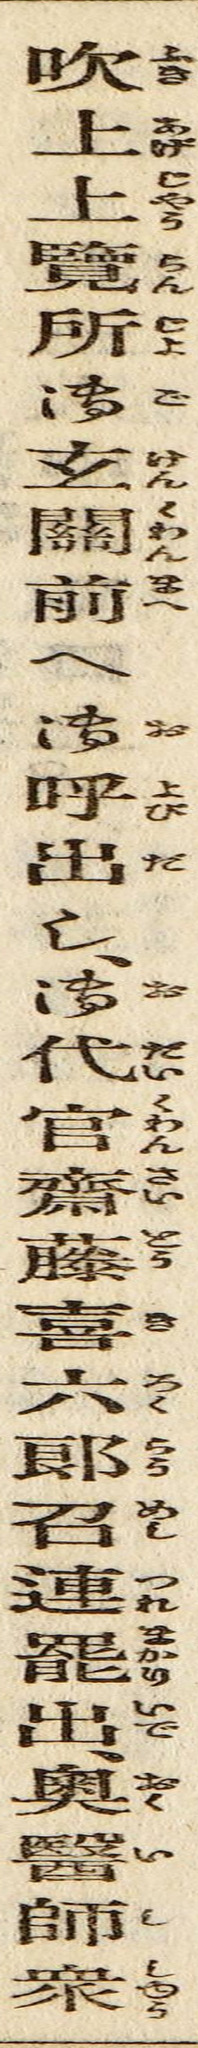吹上上覧所御玄関前へ御呼出し、御代官斎藤喜六郎召連罷出、奥医師衆
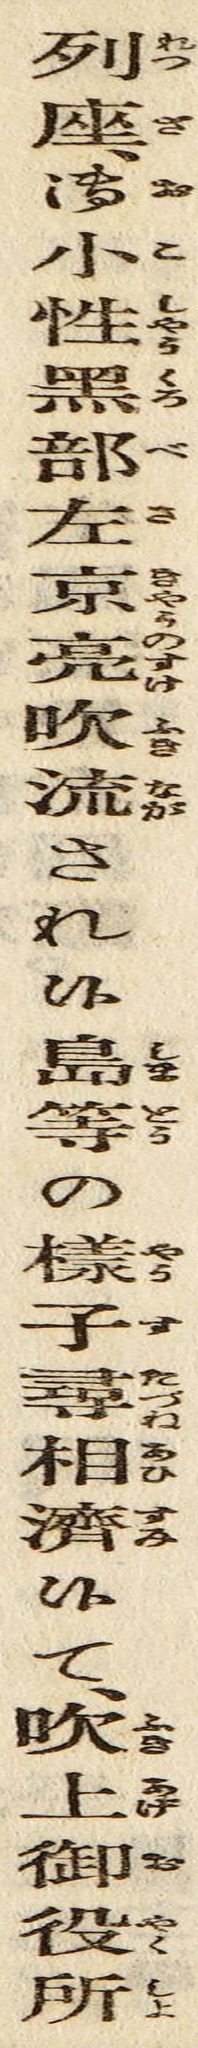列座、御小性黒部左京亮吹流され候島等の様子尋相済候て、吹上御役所
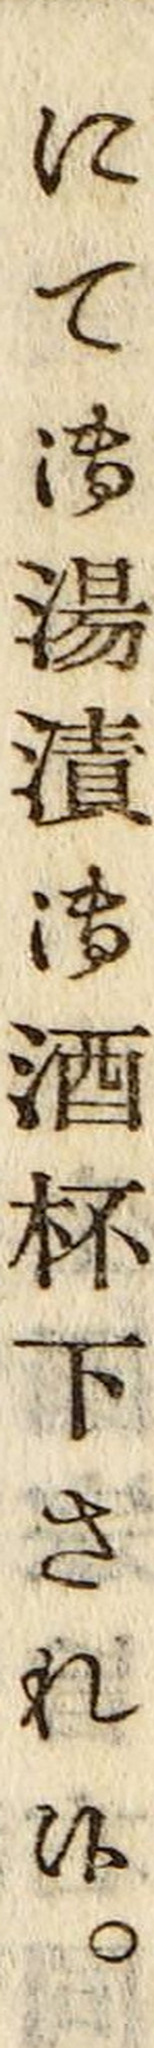にて御湯漬御酒杯下され候。
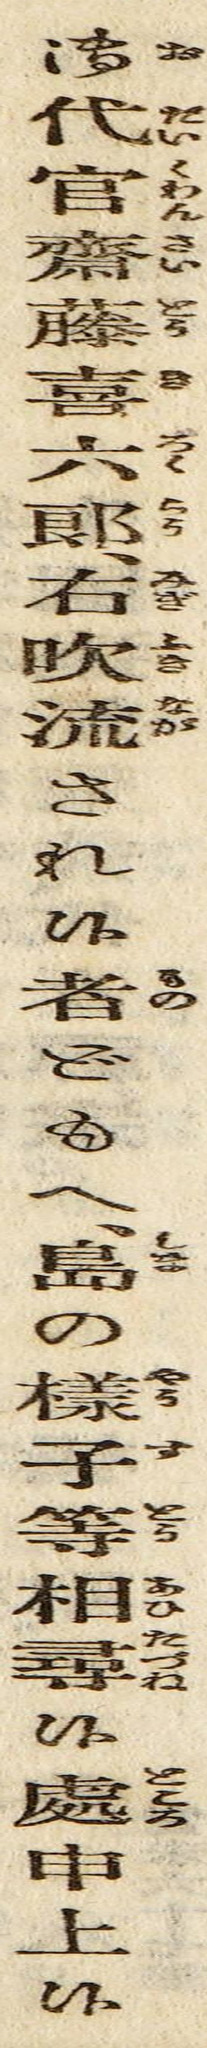御代官斎藤喜六郎、右吹流され候者どもへ、島の様子等相尋候処申上候
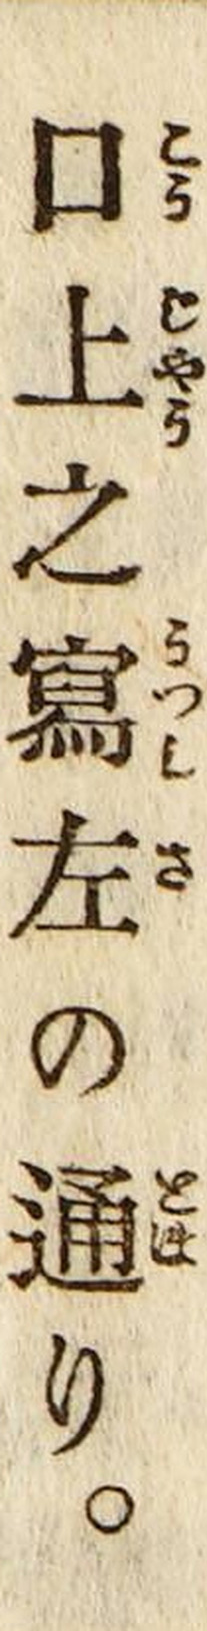口上之写左の通り。

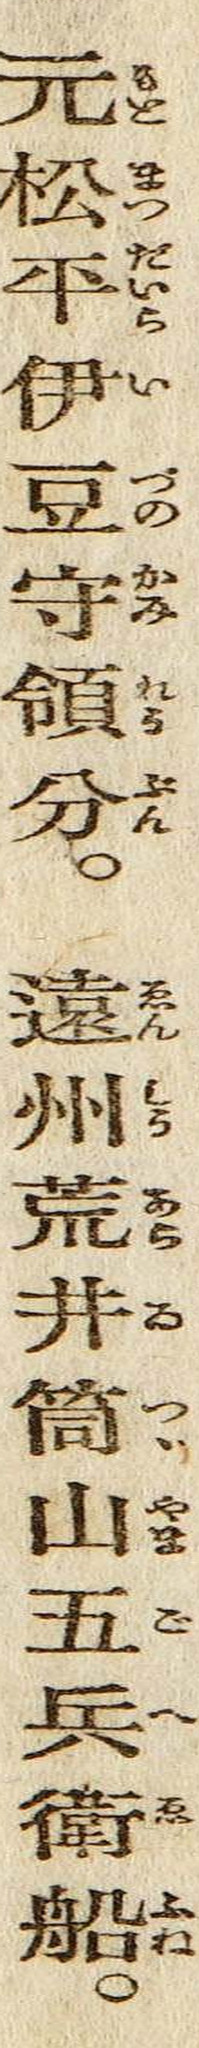元松平伊豆守領分。遠州荒井筒山五兵衛船。
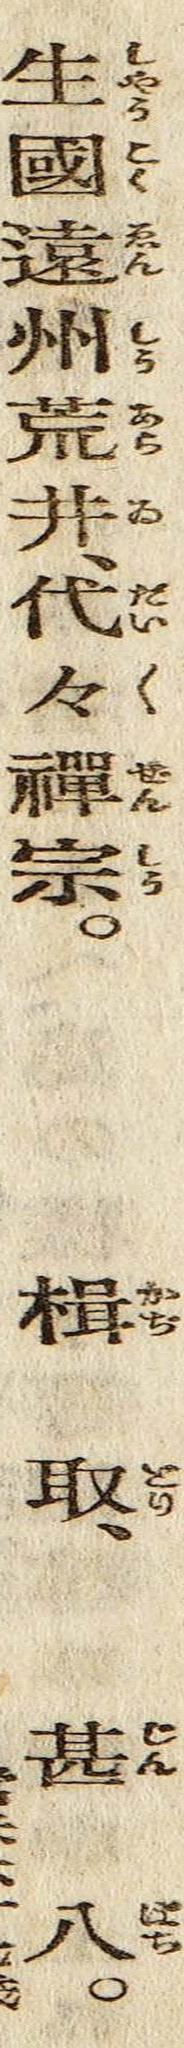生国遠州荒井、代々禅宗。楫取、甚八。
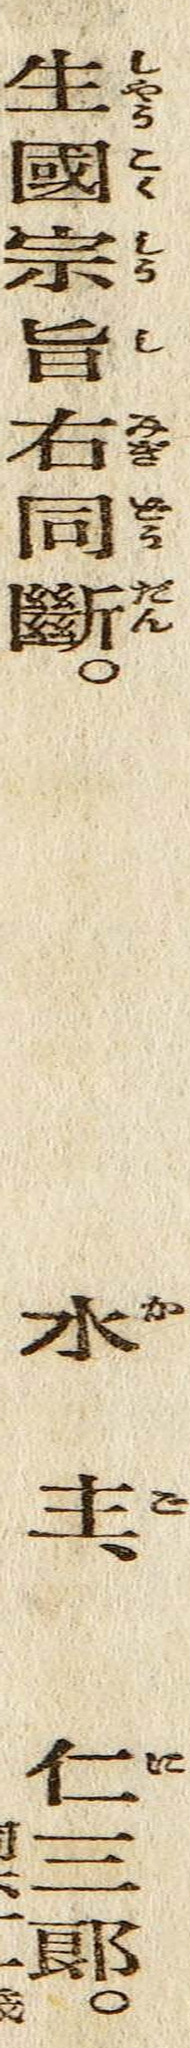生国宗旨右同断。同、平三郎。
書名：日本漂流譚
